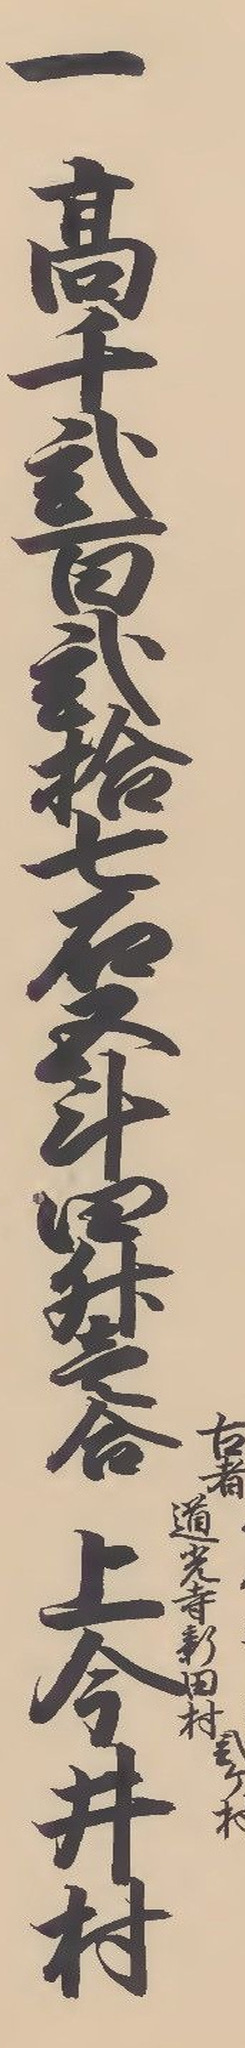一高千弐百弐拾七石五斗四升壱合上今井村

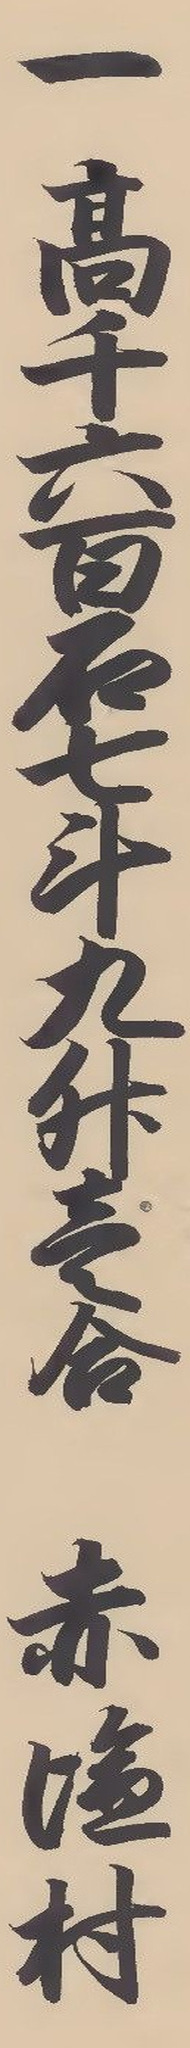一高千六百石七斗九升壱合赤塩村
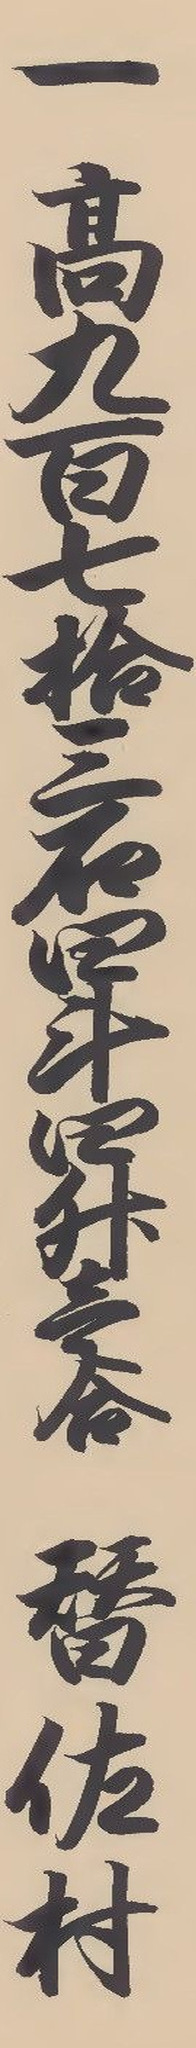一高九百七拾三石四斗四升壱合替佐村
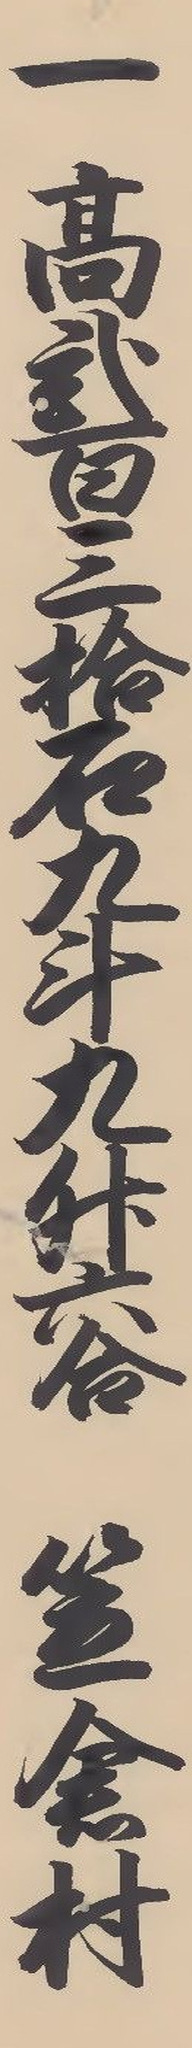一高二百三十石九斗九升六合笠倉村
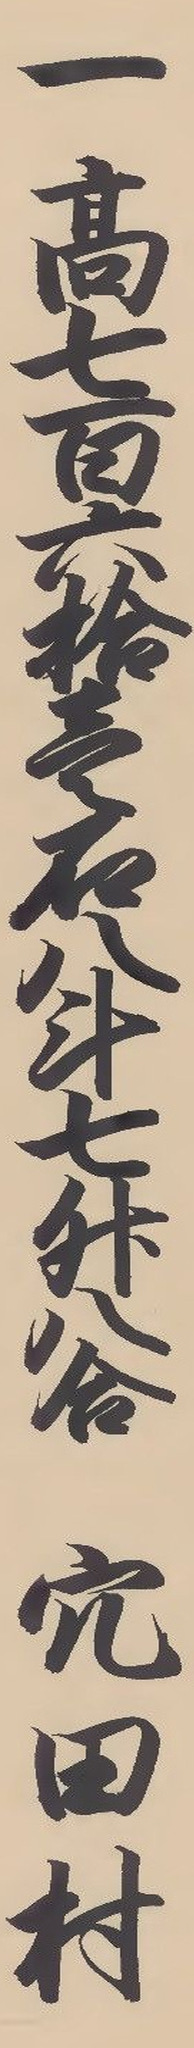一高七百六拾壱石八斗七升八合穴田村
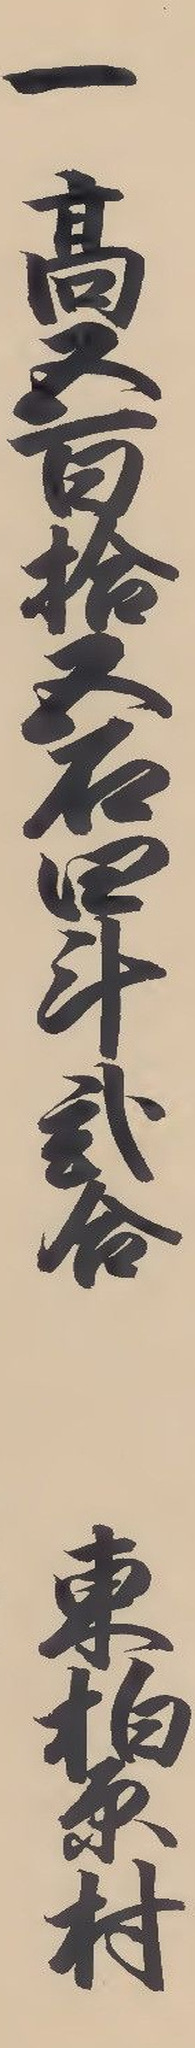一高五百拾五石四斗弐合東柏原村
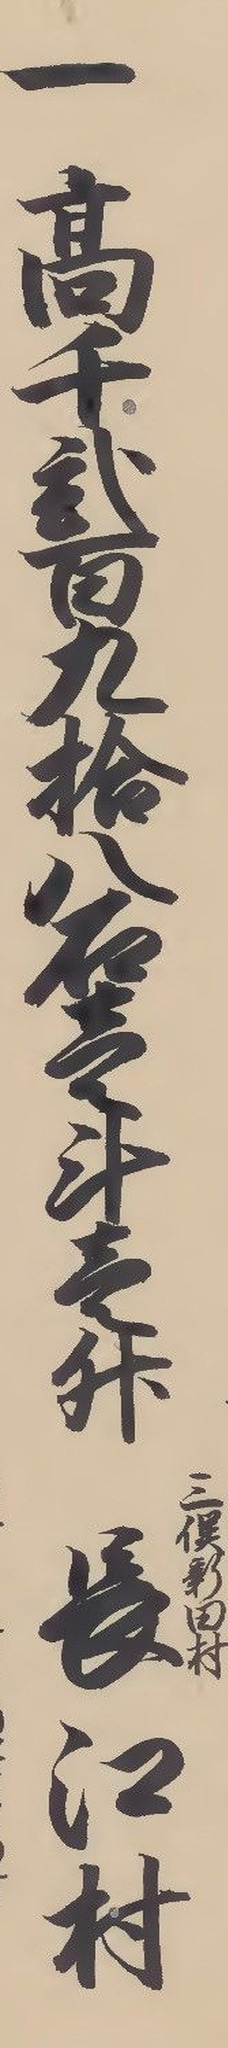一高千弐百九拾八石壱斗壱升長江村
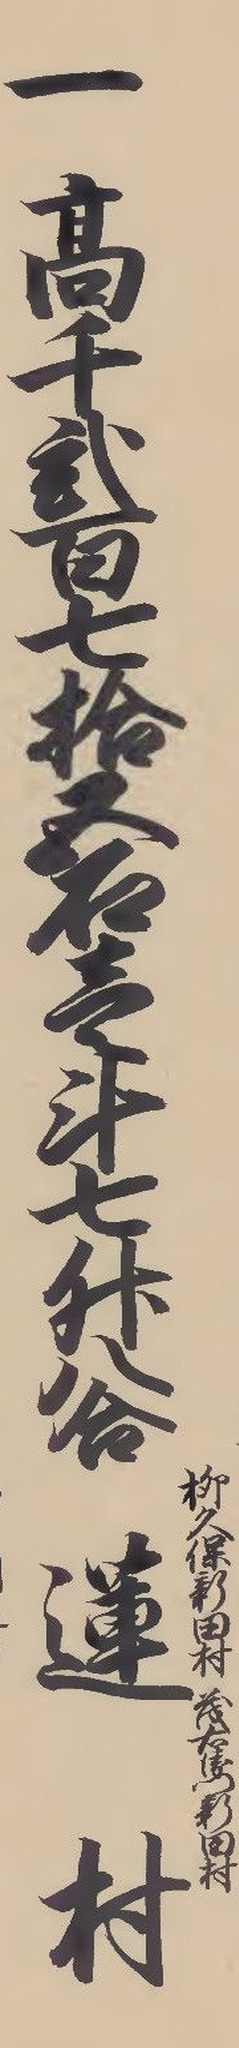一高千弐百七拾五石壱斗七升八合蓮村
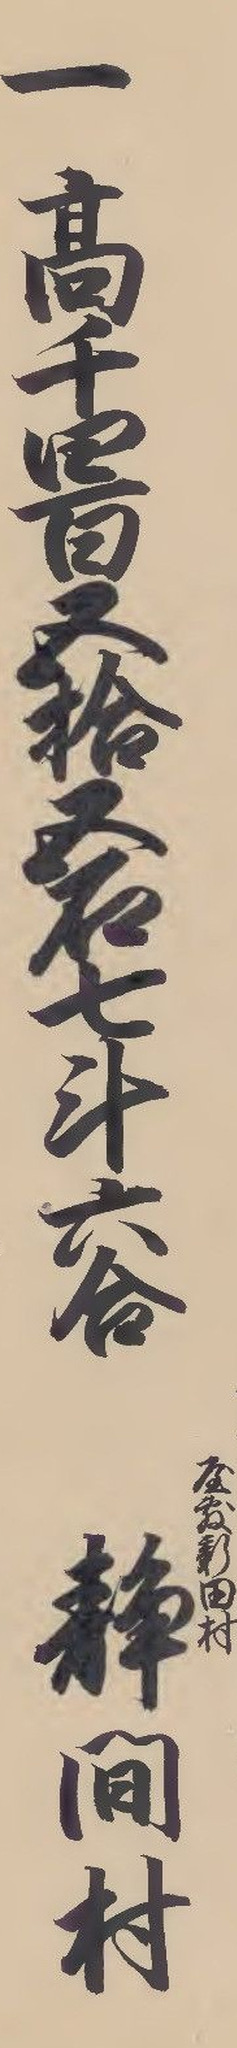一高千四百五拾五石七斗六合静間村

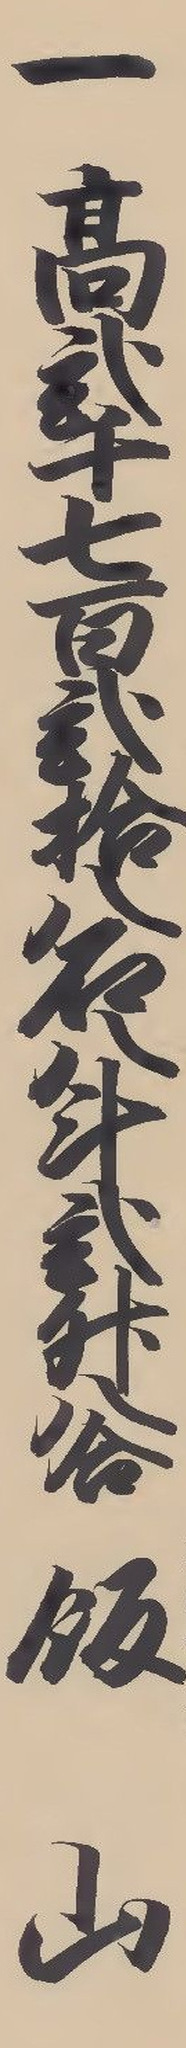一高弐千七百弐拾八石八斗弐升八合飯山
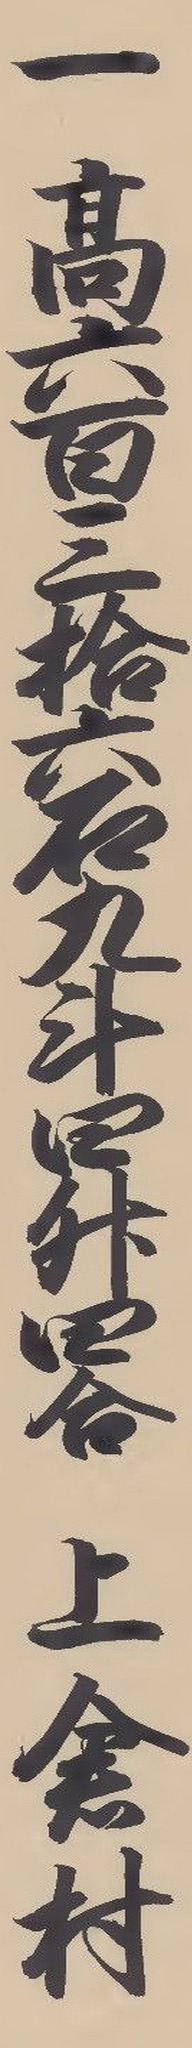一高六百三拾六石九斗四升四合上倉村
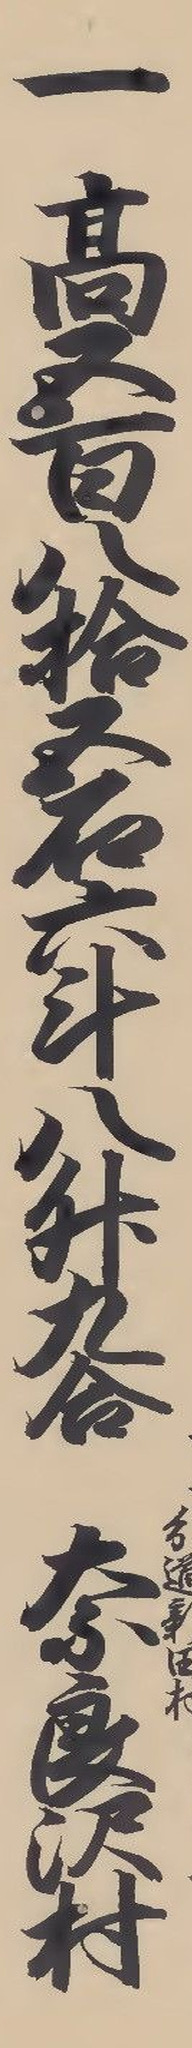一高五百八拾五石六斗八升九合奈良沢村
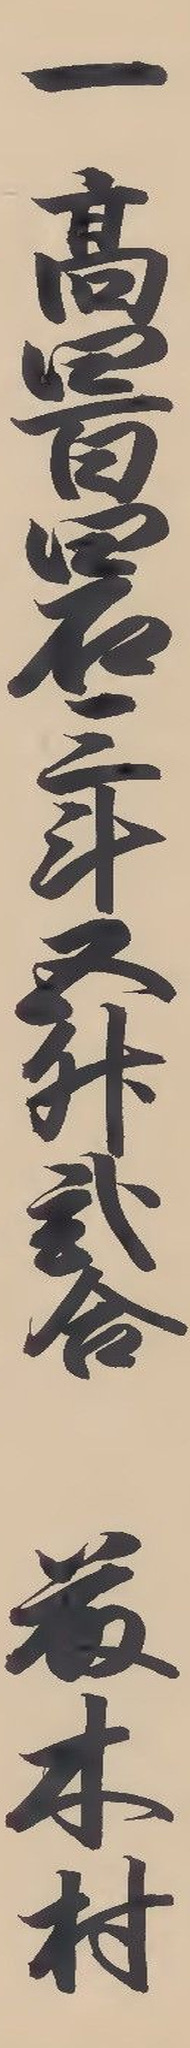一高四百四石三斗五升弐合藤木村
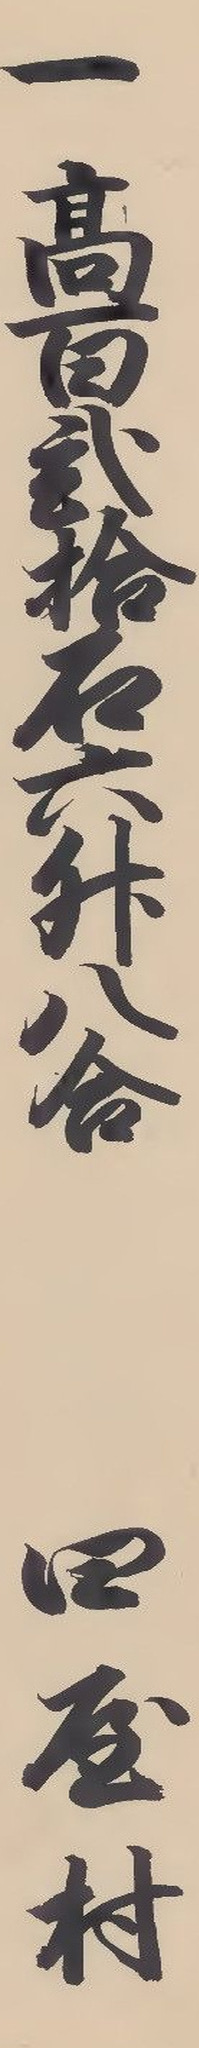一高百弐拾石六升八合四屋村
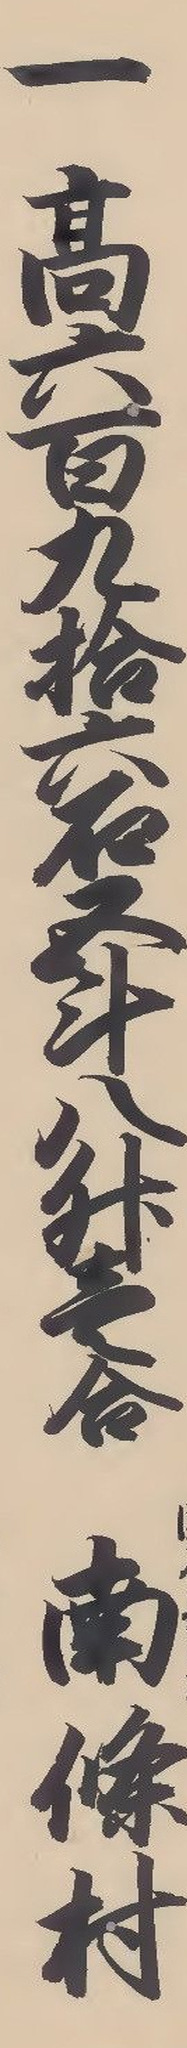一高六百九拾六石五斗八升壱合南条村
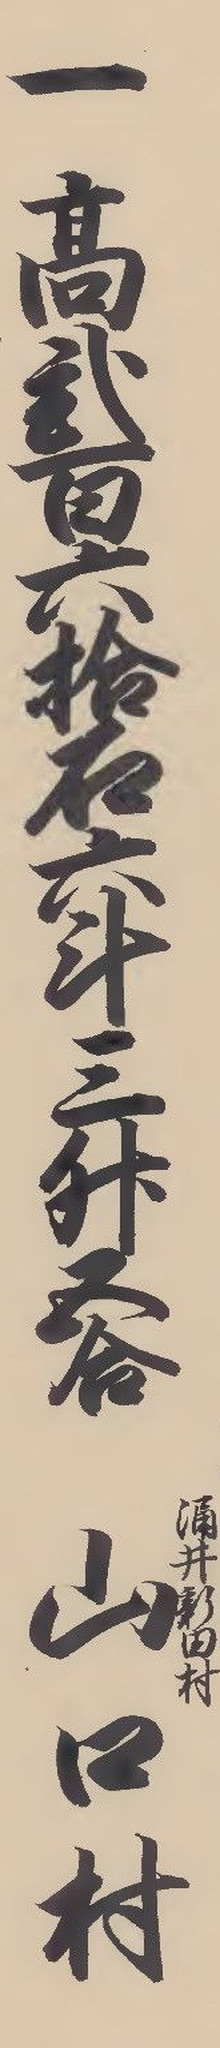一高弐百六拾石六斗三升五合山口村
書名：信濃国郷帳
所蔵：国立公文書館 National Archives of Japan
